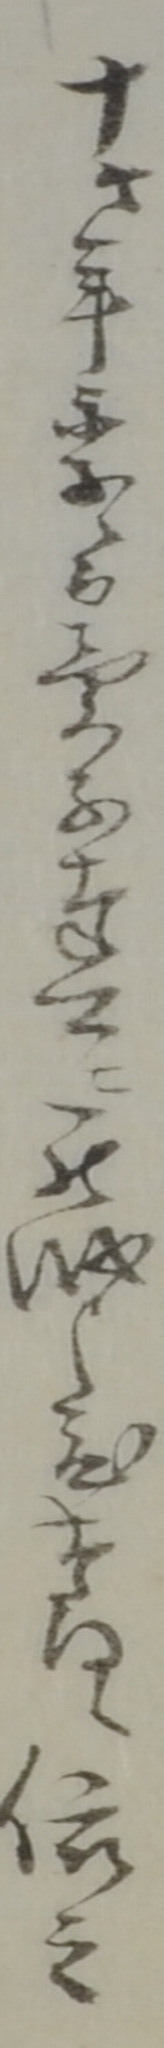十ケ年季ニ而売子奉公ニ罷越申度奉存候依之
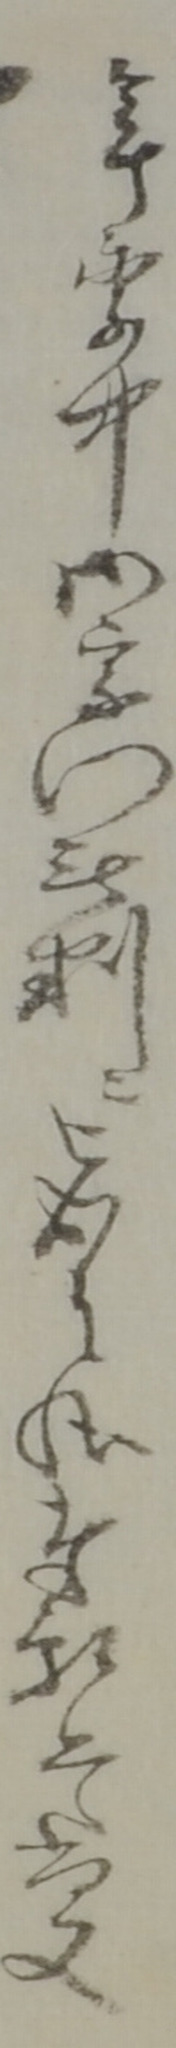年季中御宗門無判ニ被成下候様奉願上候尚又
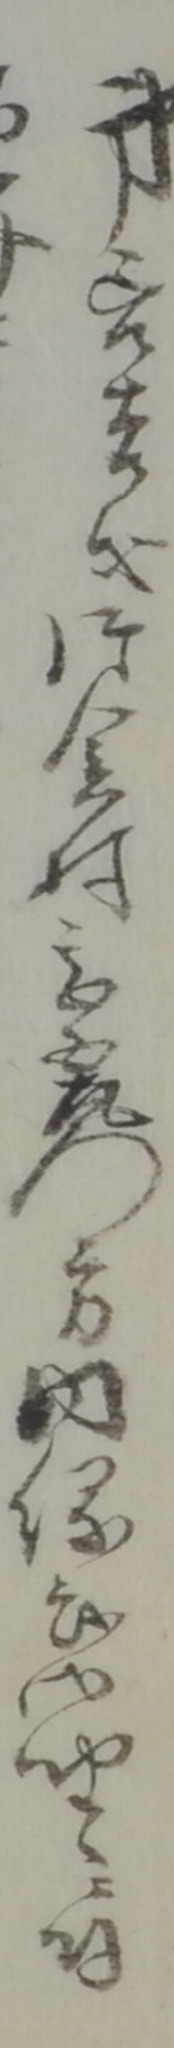弟善吉義片倉村甚五左衛門方内縁も御座候ニ付
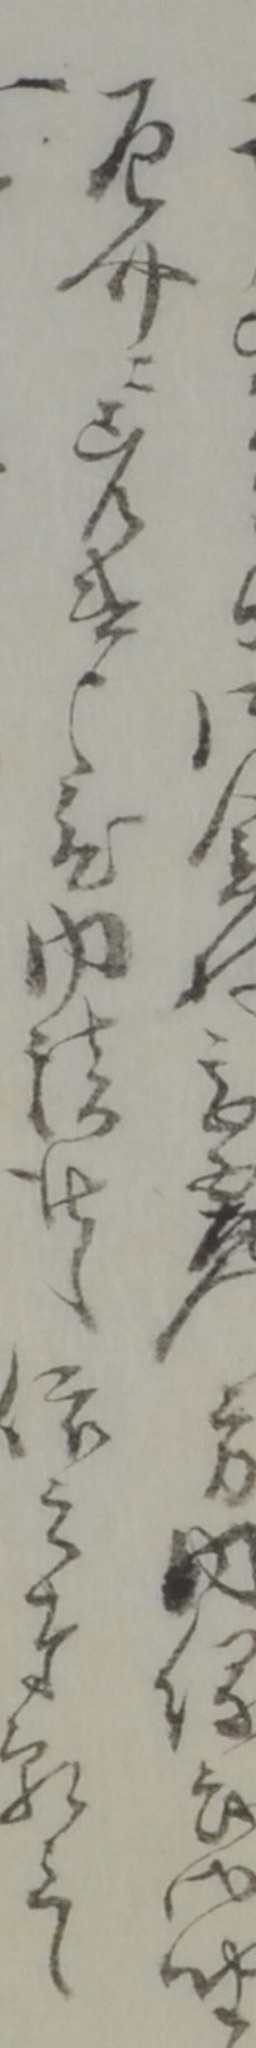厄介ニ差遣申度内談仕候依之奉願上候
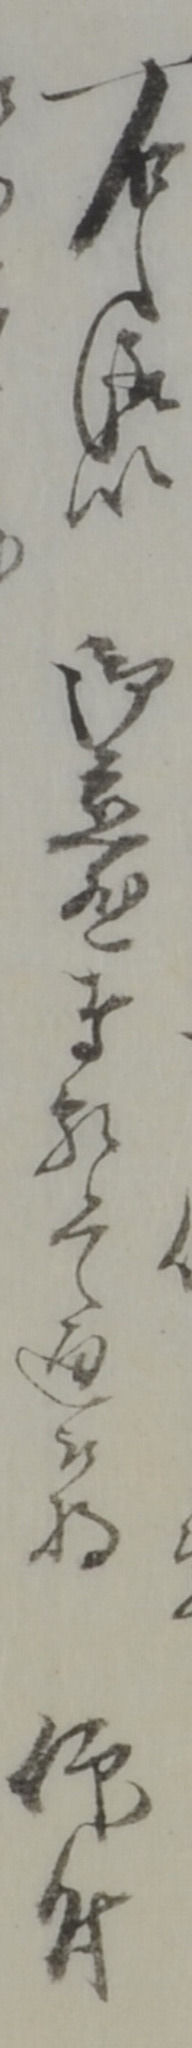右之趣以御慈悲奉願上候通被為仰付
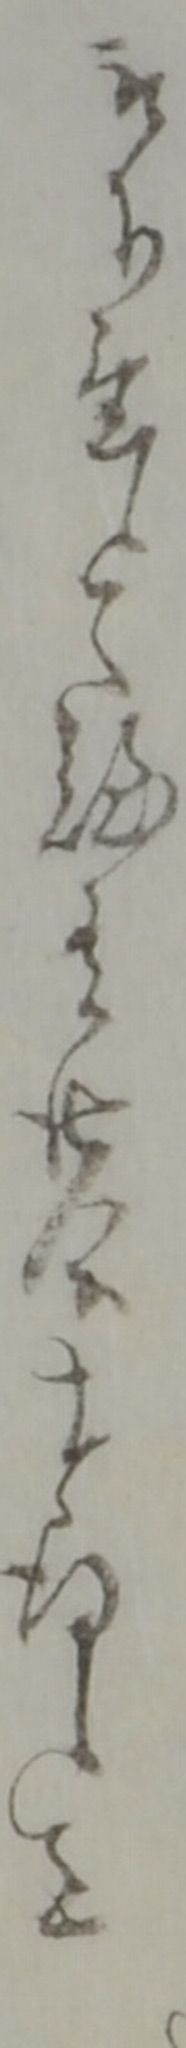被下置候ハヽ難有仕合奉存候以上
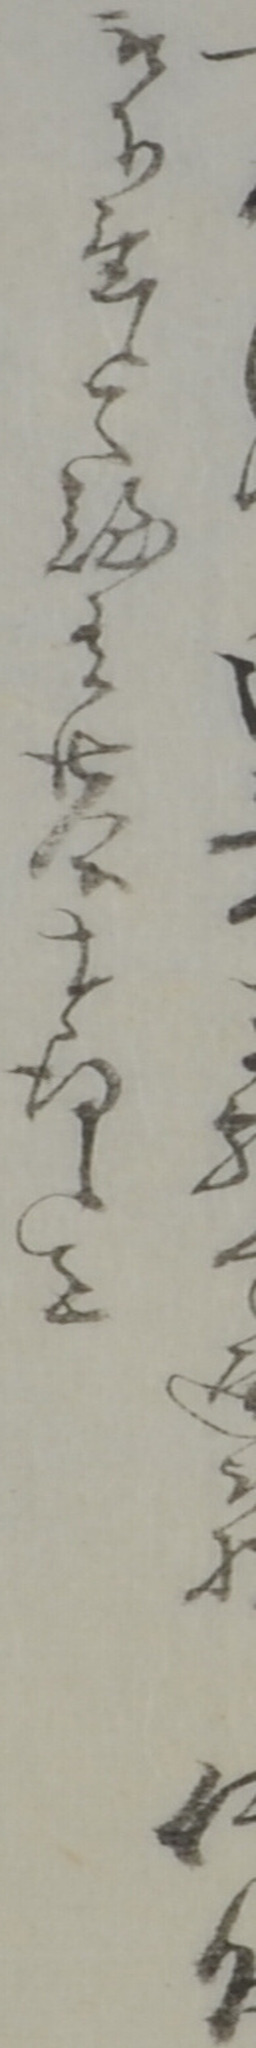被下置候ハヽ難有仕合奉存候以上
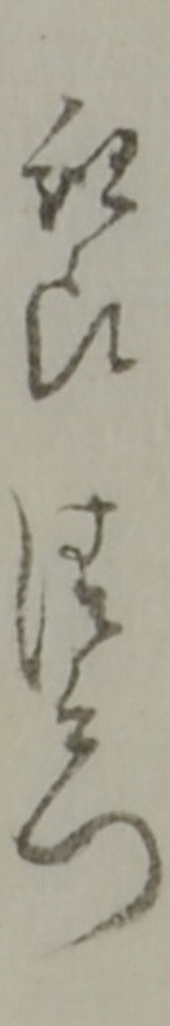組頭清右衛門
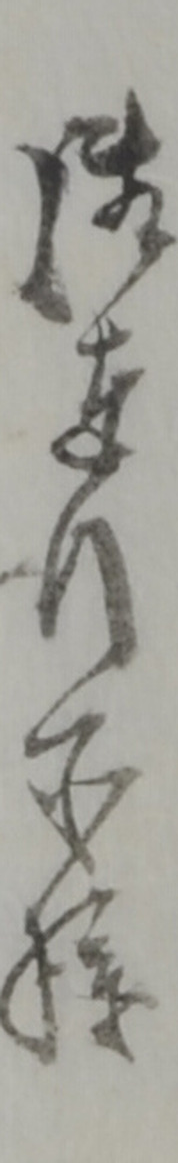御奉行所様

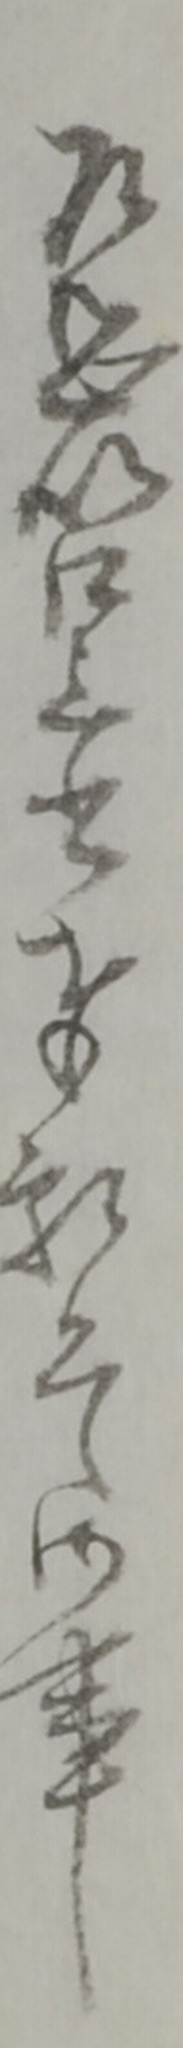乍恐以口上書奉願上候御事
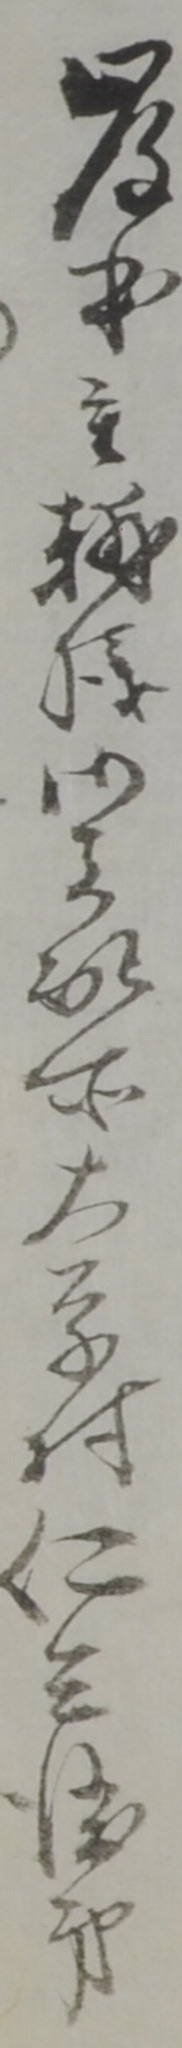岸本重輔様御支配所大草村仁兵衛弟
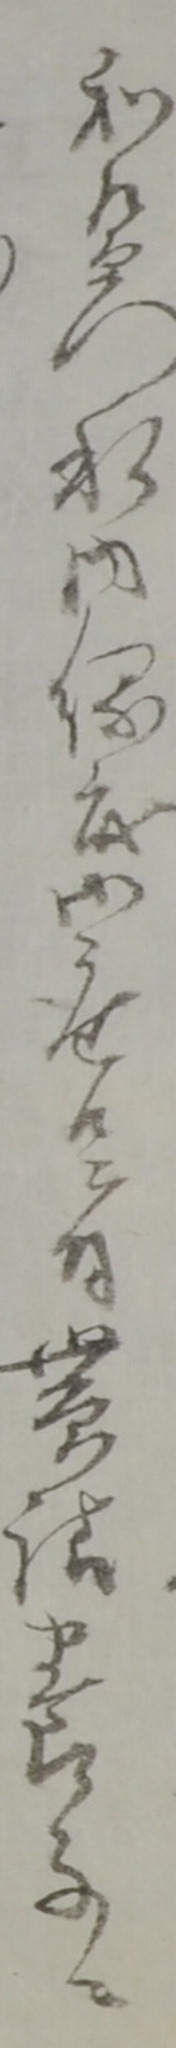和左衛門私内縁も御うせ候ニ付貰請養子ニ
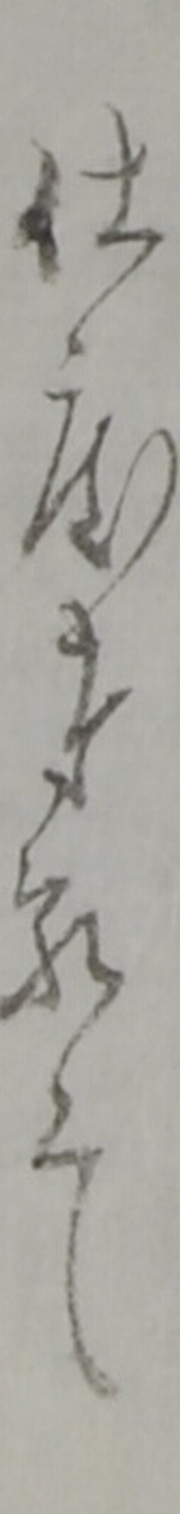仕度奉願上候
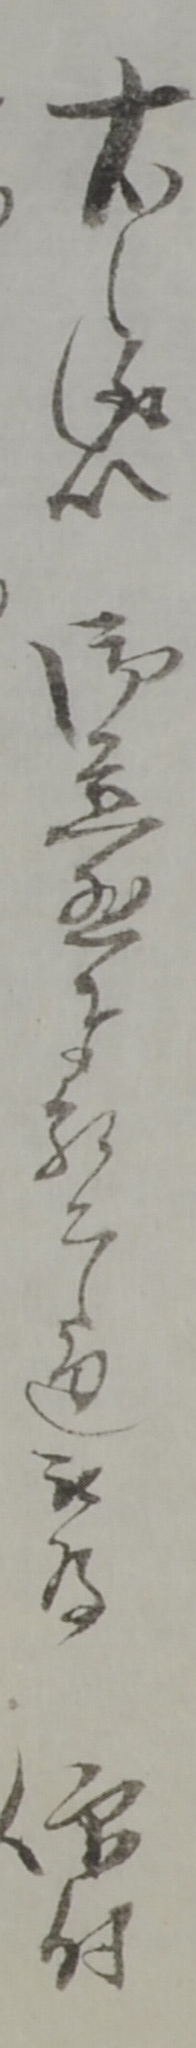右之儀以御慈悲奉願上之通被為仰付
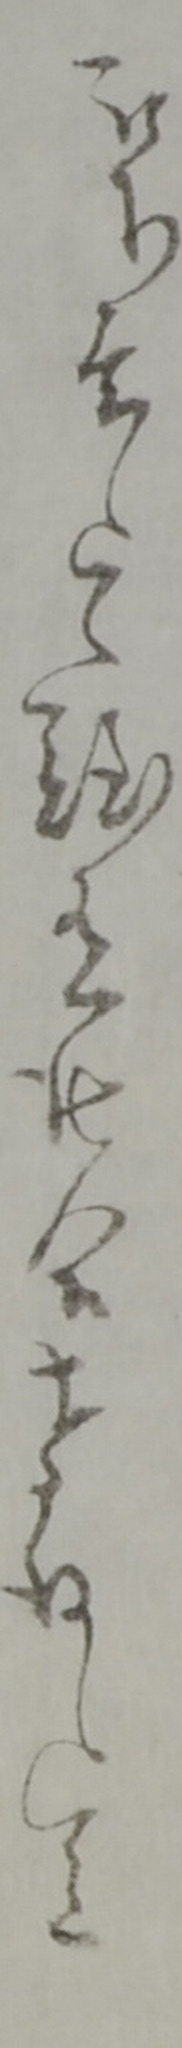被下置候ハヽ難有仕合奉存候已上
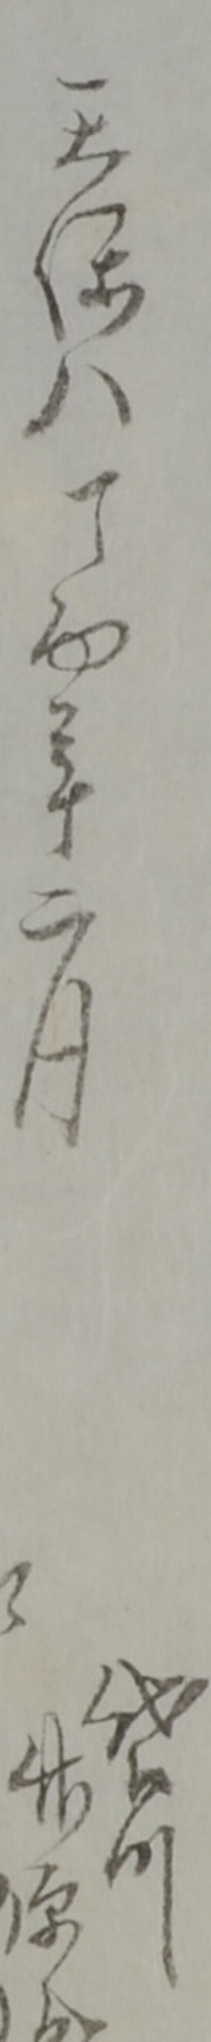天保八丁酉年二月竹原屋
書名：諸願書控帳
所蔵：伊那市立高遠町図書館・合同会社AMANE
